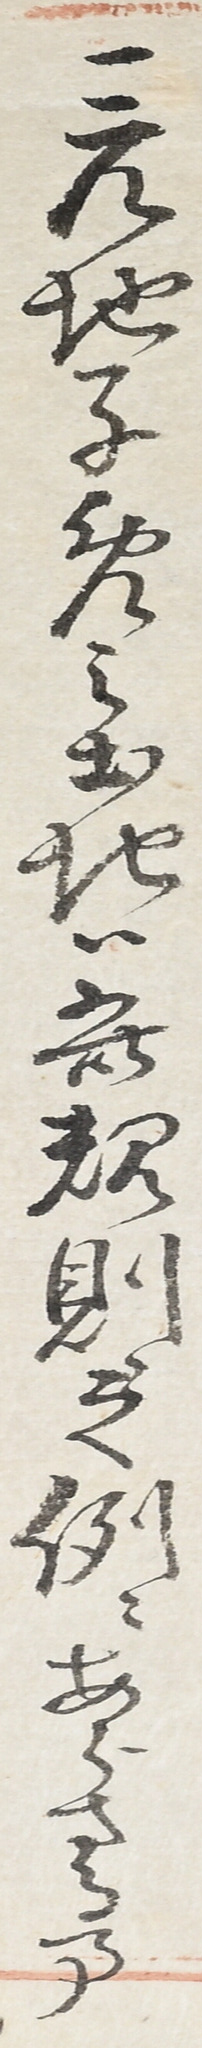一元地子免之土地は此規則之例にあらさる事
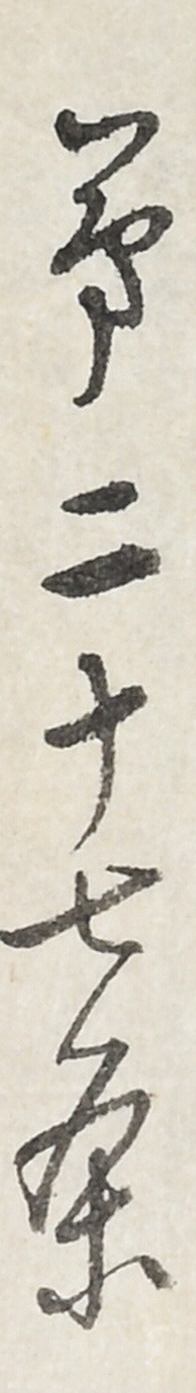第二十七条
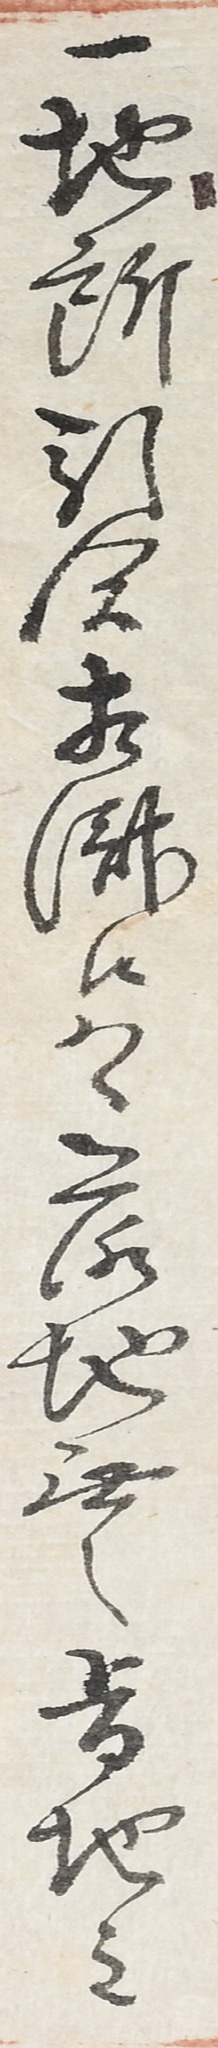一地所引合相済候はゝ落地無之旨地主
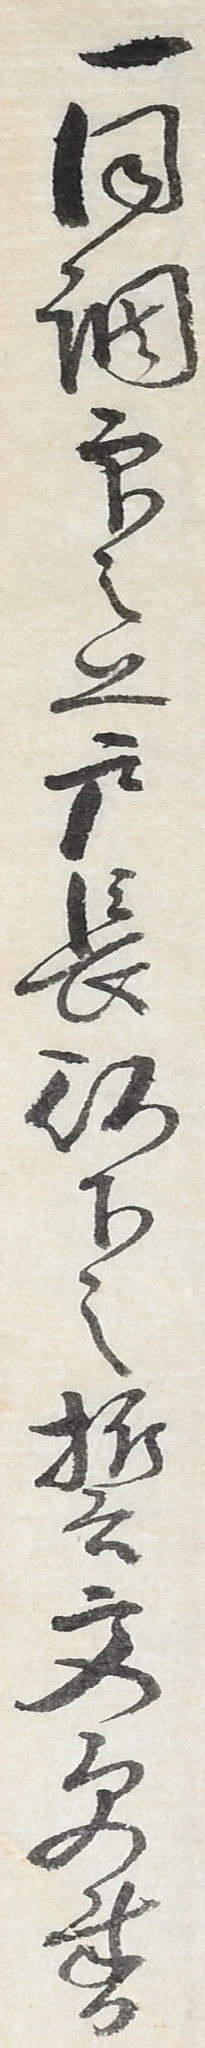一同調印之上戸長以下之誓文受書

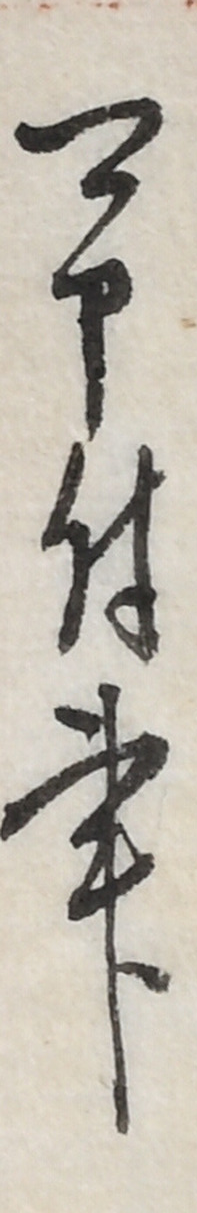可申付事
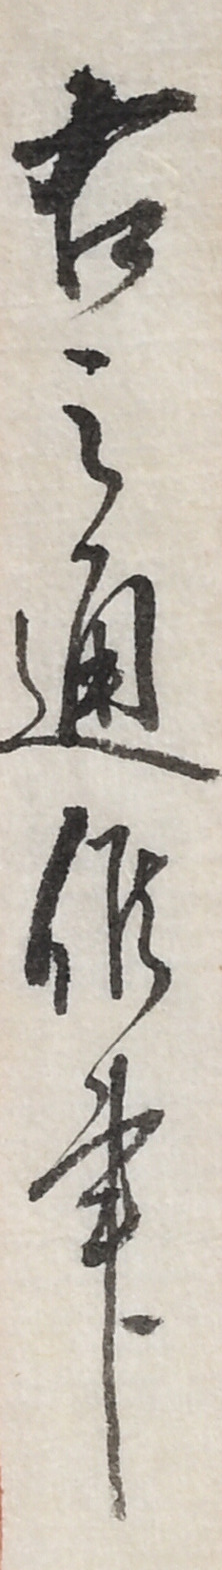右之通作事
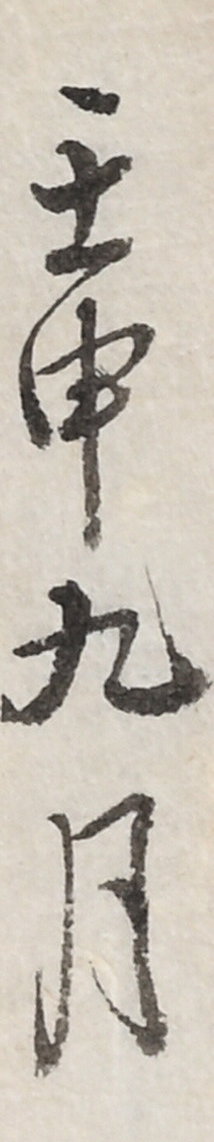壬申九月
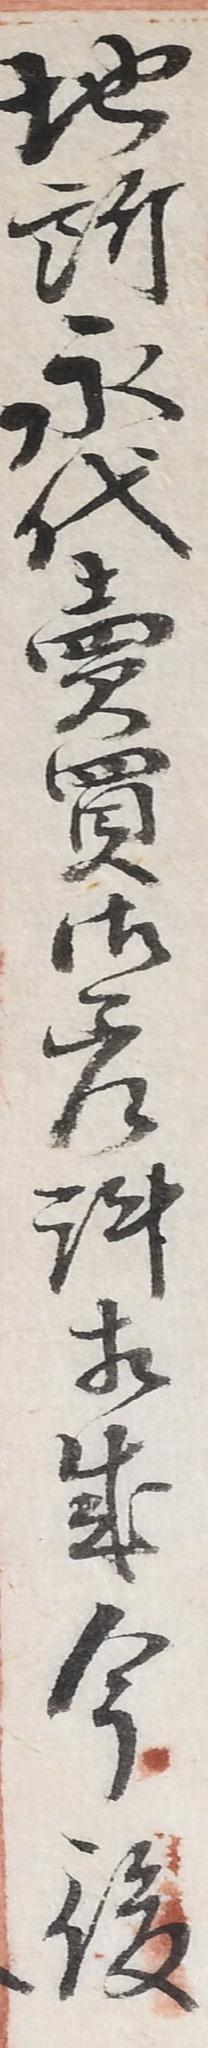地所永代売買御差許相成今後
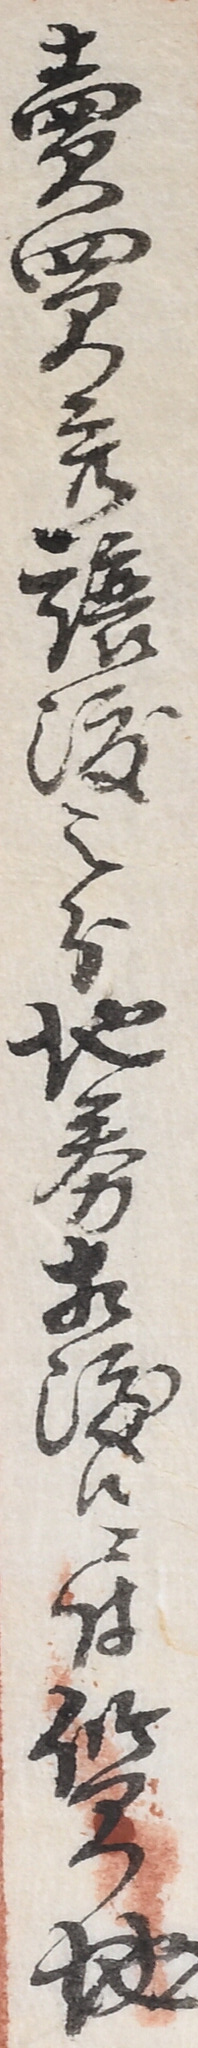売買幷譲渡之分地券相渡候に付質地
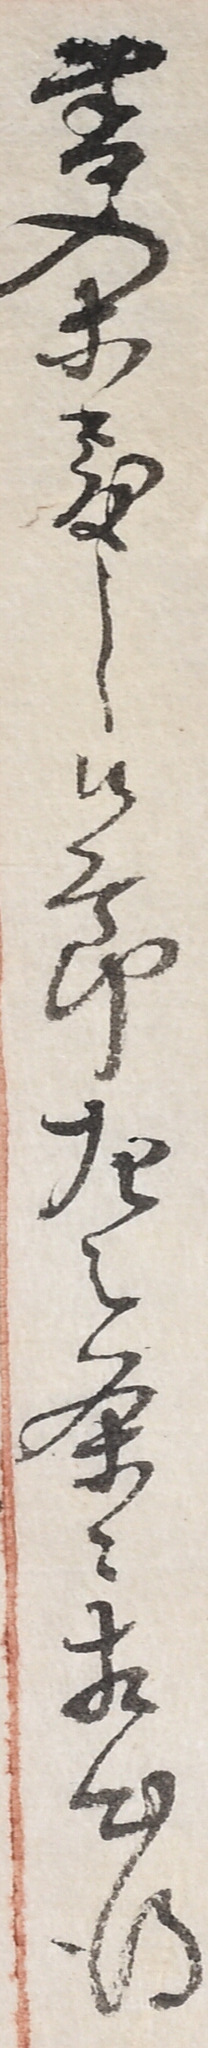書入等致し候節左之条に相心得
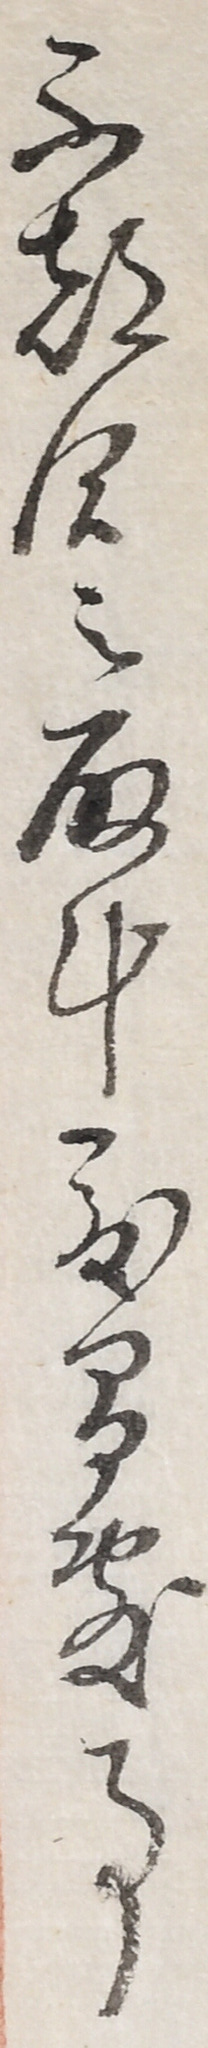不都合之取計致間敷事
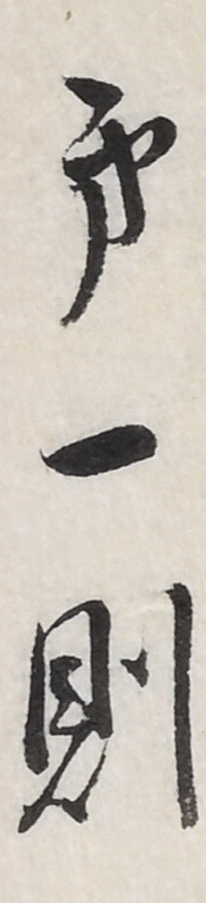第一則
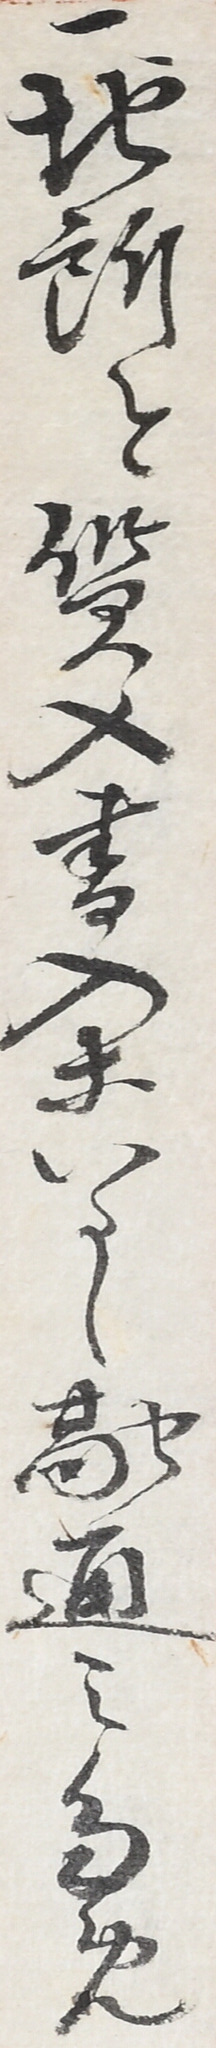一地所と質入書入等いたし融通之ため
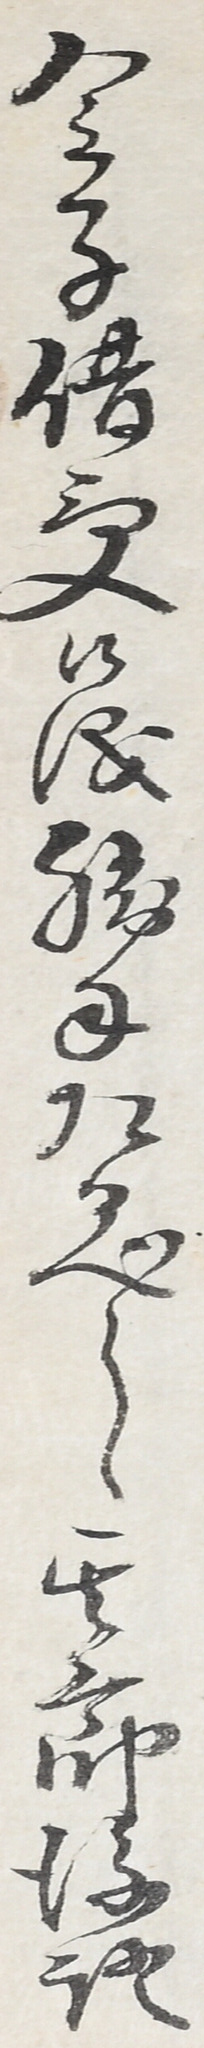金子借受候儀勝手たるべし其節後れ
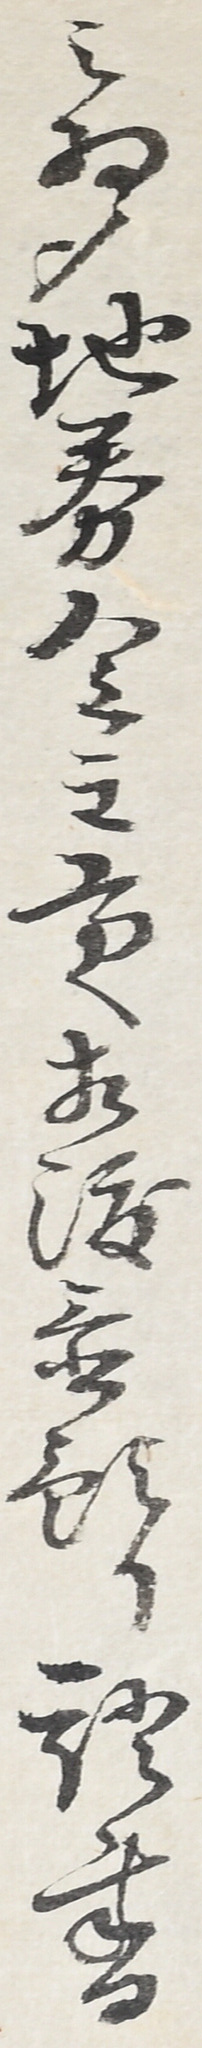之為メ地券金主方へ相渡置預り証書
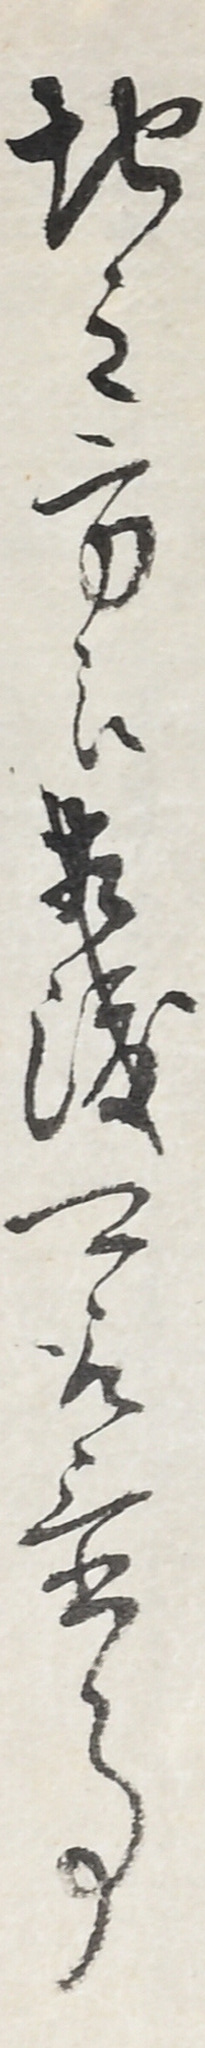地主方え相渡可取置事
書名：壹番・御布告一式
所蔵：伊那市立高遠町図書館・合同会社AMANE
